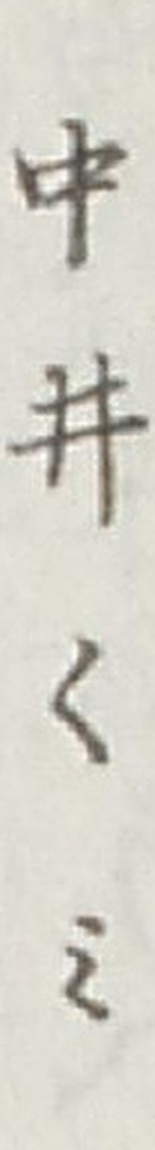中井くみ
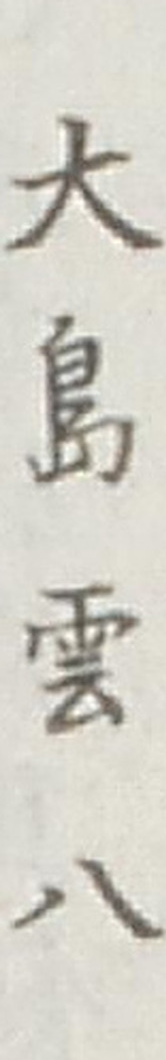大島雲八
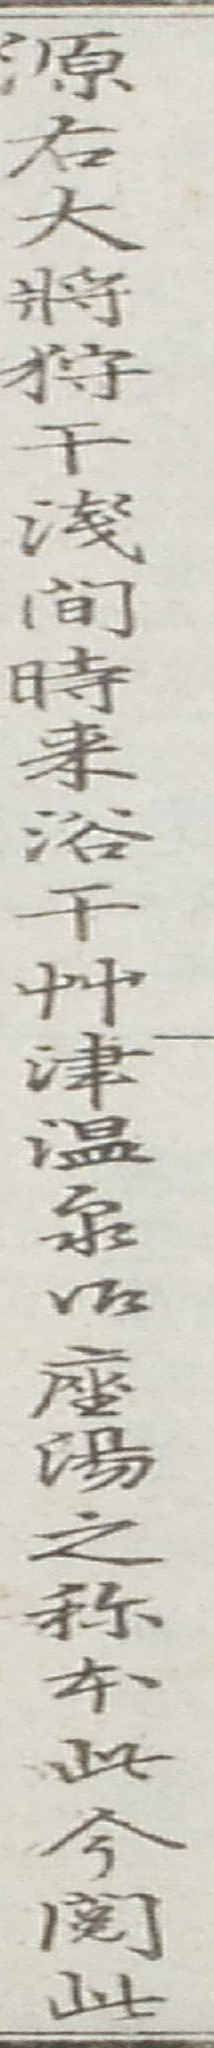源右大将狩干浅間時来浴干艸津温泉御座湯之称本此今閲此
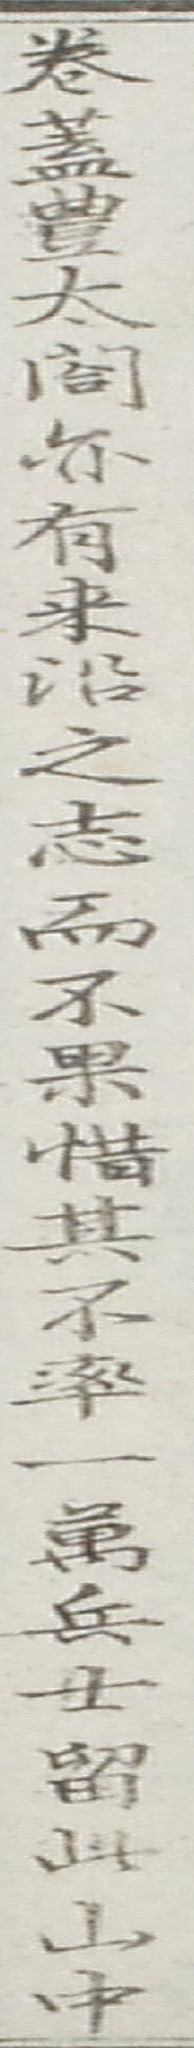巻蓋豊太閤亦有来沿之志而不果惜其不率一萬兵士留此山中
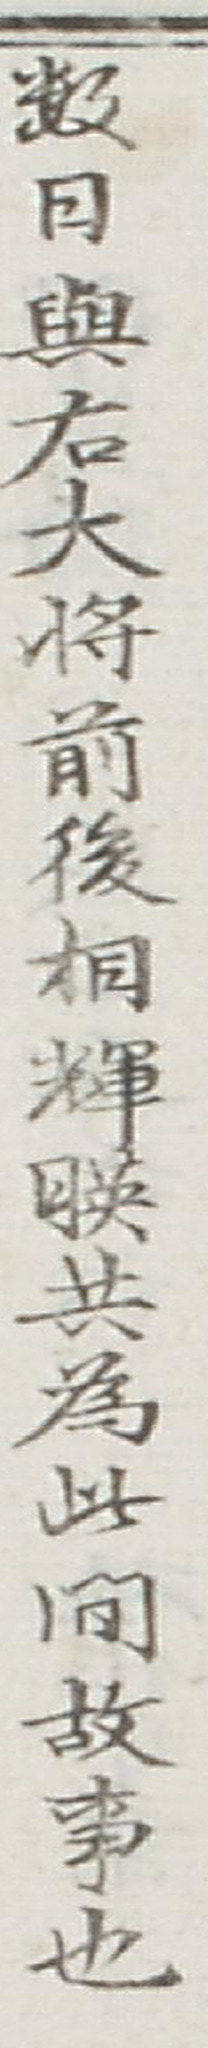数日興右大将前後桐輝暎共為此間故事也
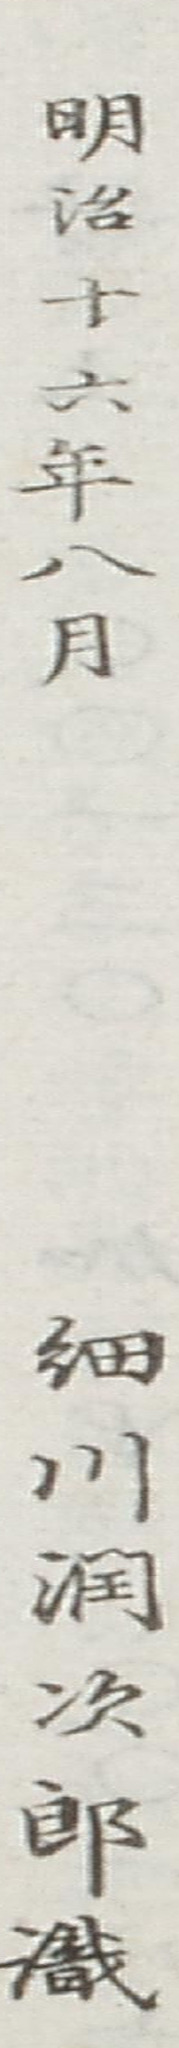明治十六年八月細川潤次郎識
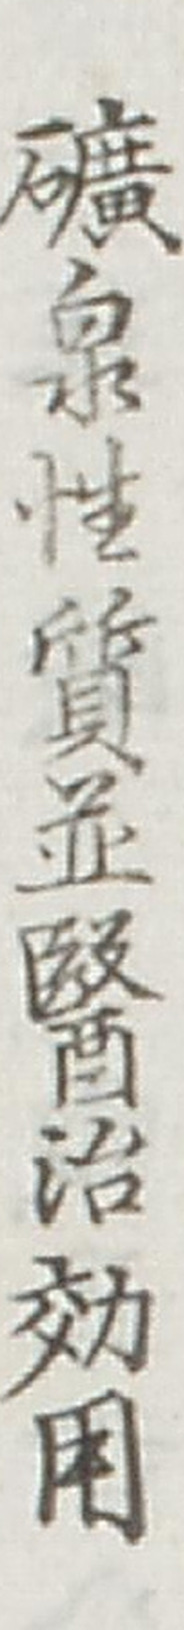礦泉性質並医治効用
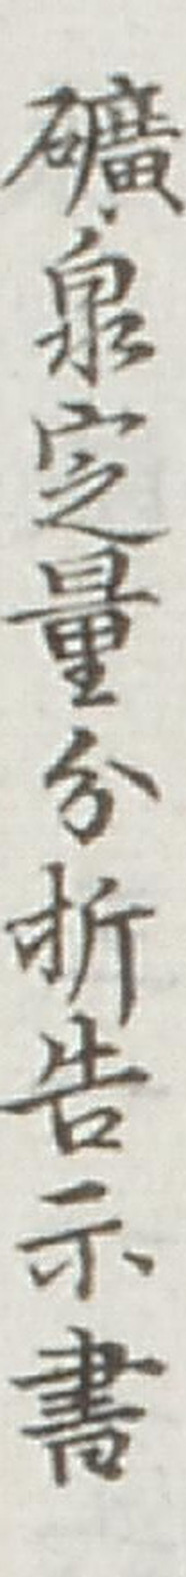礦泉定量分析告示書
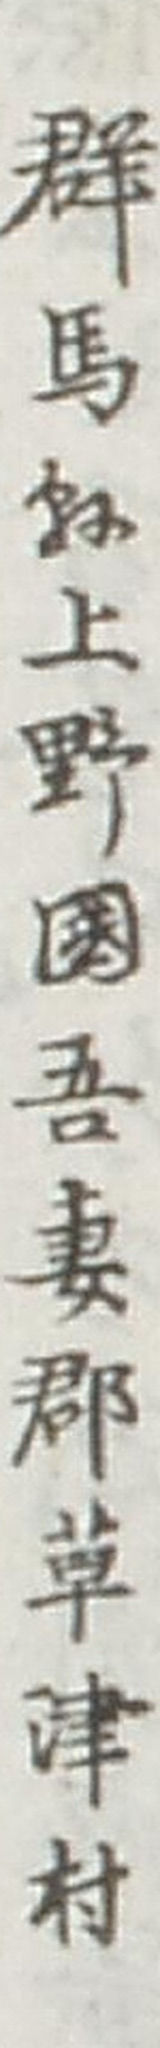群馬県上野国吾妻郡草津村
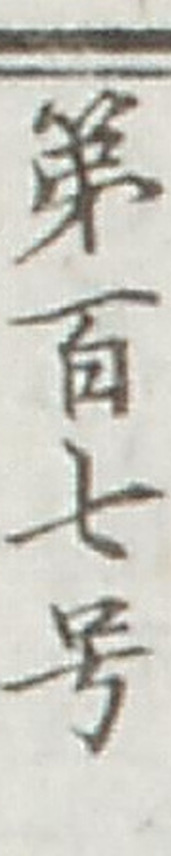第百七号
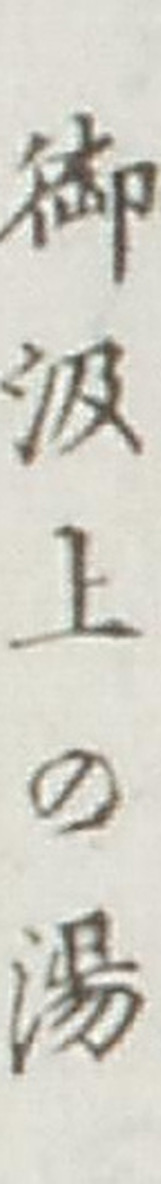御汲上の湯
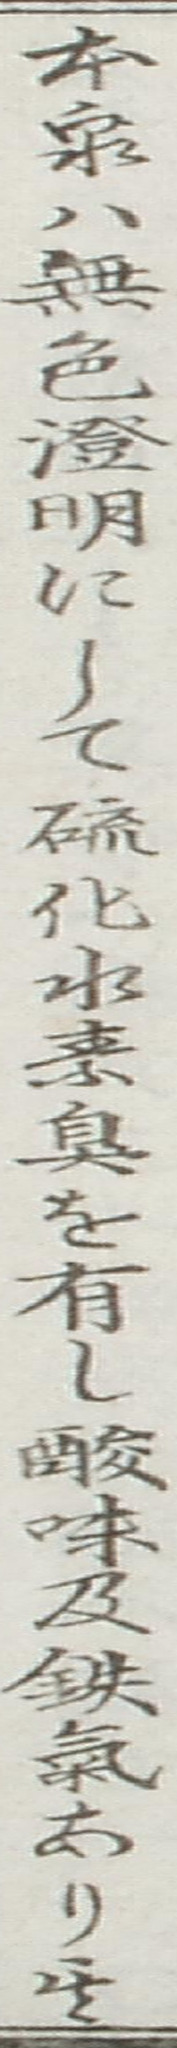本泉ハ無色澄明にして硫化水素臭を有し酸味及鉄氣あり其

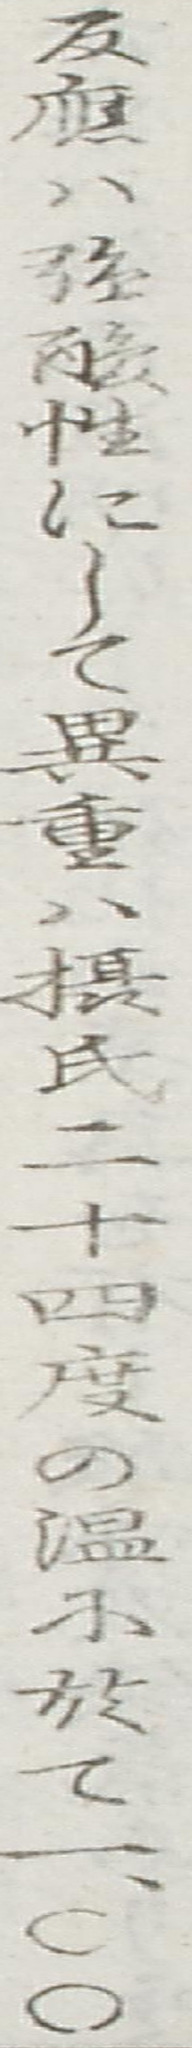反応は強酸性にして異重は摂氏二十四度の温に於て一、〇〇
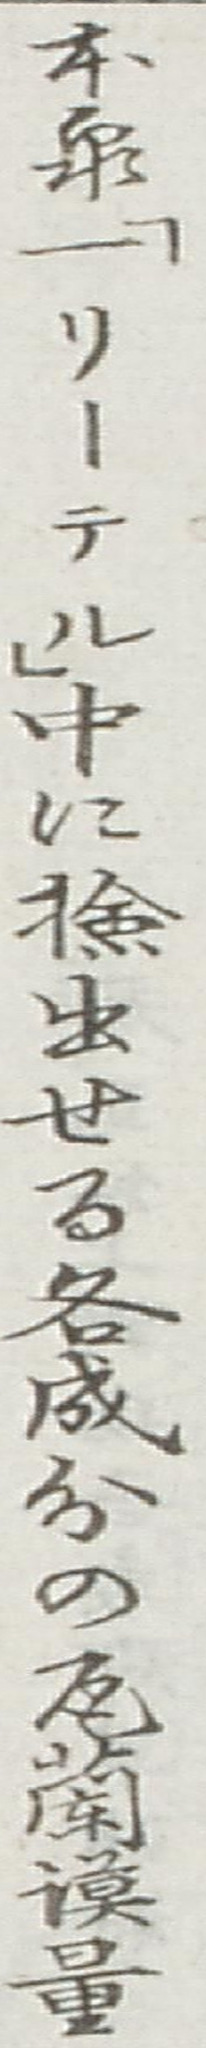本泉「一リーテル」中に検出せる各成分の瓦蘭漠量
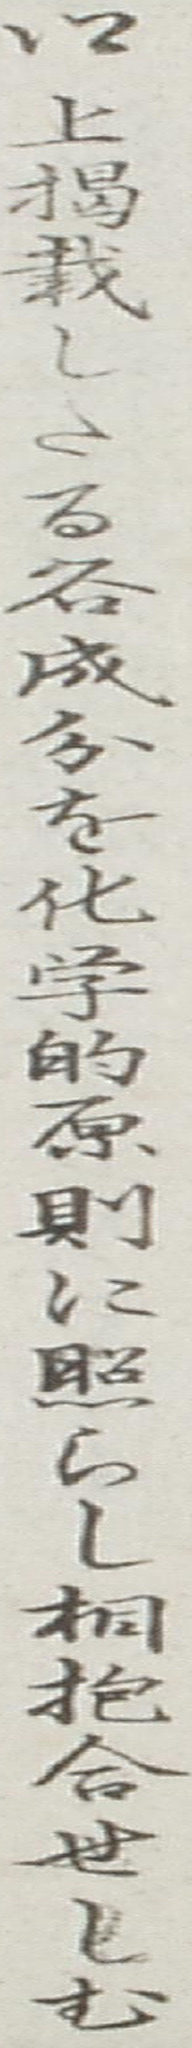以上掲載したる各成分を化学的原則に照らし相抱合せしむ
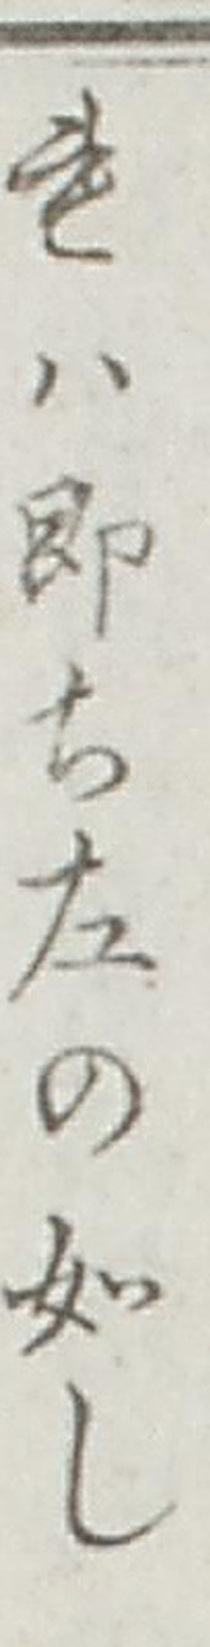きは即ち左の如し
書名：草津温泉誌　全
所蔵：東京大学地震研究所図書室 Earthquake Research Institute Library, The University of Tokyo, JAPAN
